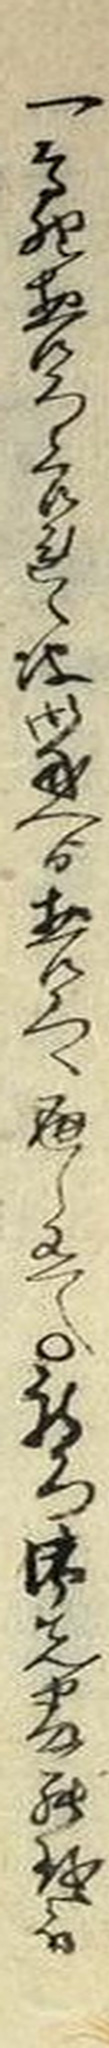一高野惣左衛門召連候儀御用人ゟ惣左衛門へ通し有之〇新右衛門御先番罷越候付
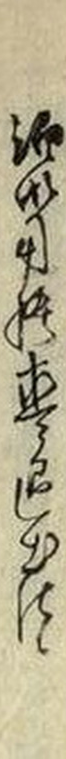聊御用捨直々退出仕候
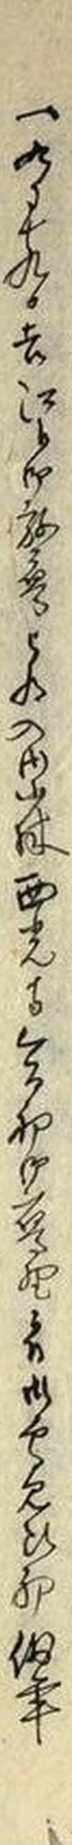一九月十九日吉江江御放鷹被為入御小休西光寺今日初御鷹野ニ付御鳥見頭初例年
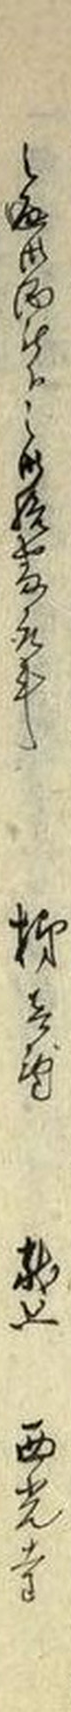之通御酒被下之御膳番取斗柿壱台献上西光寺
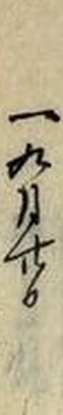一九月廿日
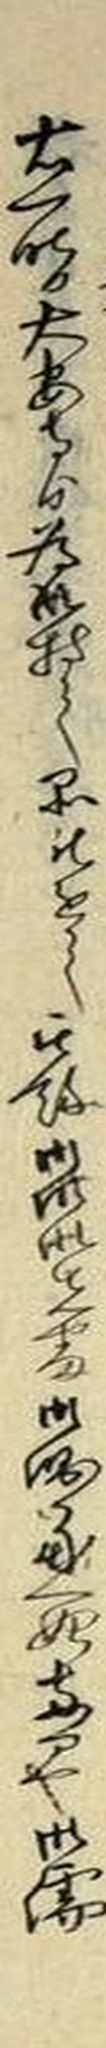右一昨日大安寺ゟ為御持之品被進之其餘御供御先番御側御用人始両部や御儒

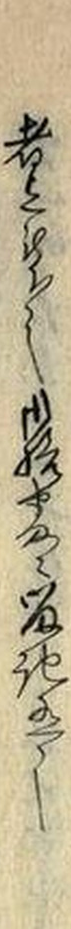者迄被下之御膳番ニ留記有之
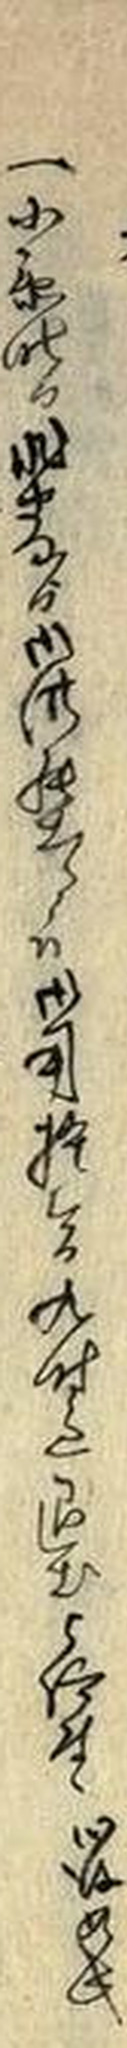一小兵衛昨日非番ゟ御供罷出候ニ付御用捨今日九時過退出被仰付候以後如此
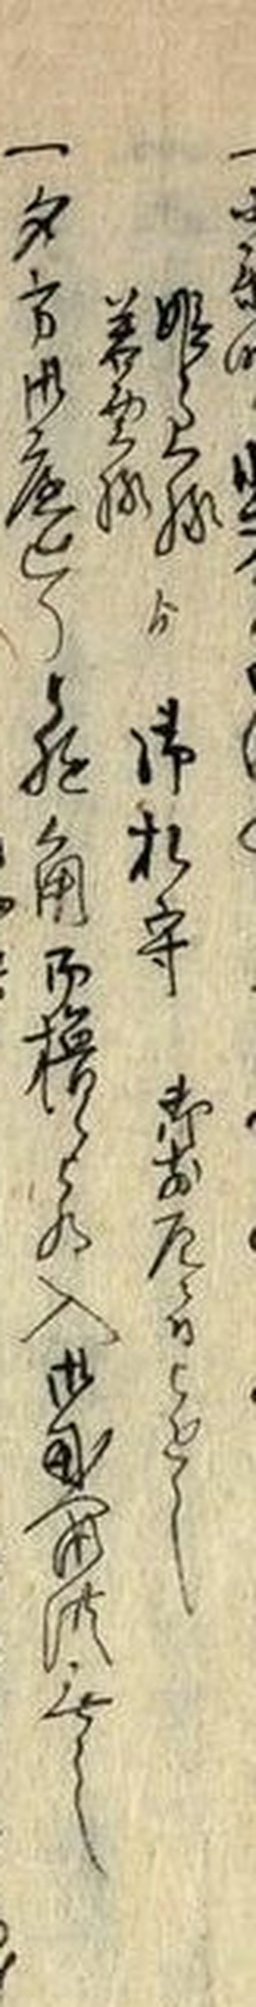一夕方御庭廻り被遊角御櫓へ被為入御用人御供無之
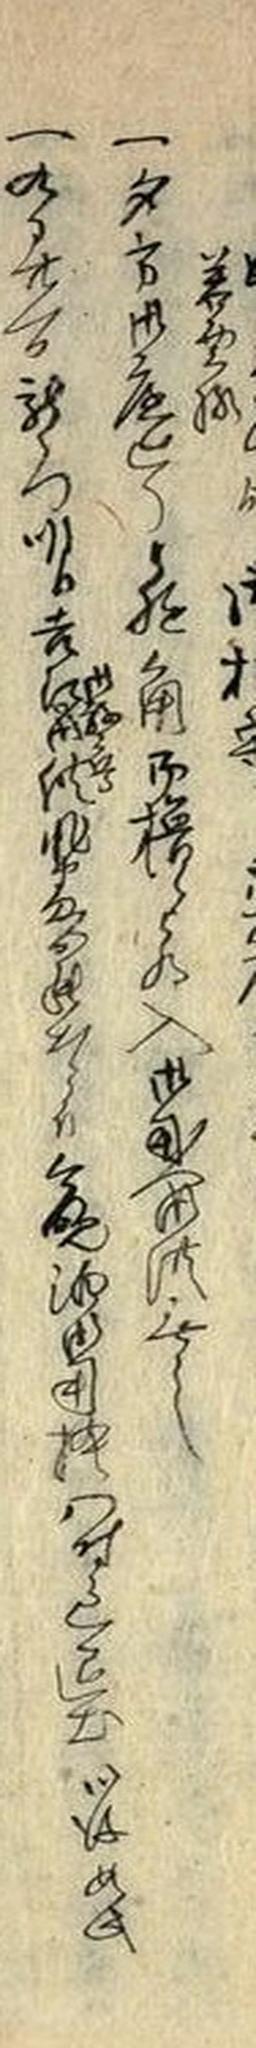一九月廿一日新右衛門明日吉江御放鷹御供非番ゟ罷出候ニ付今晩泊御用捨八時過退出以後如此
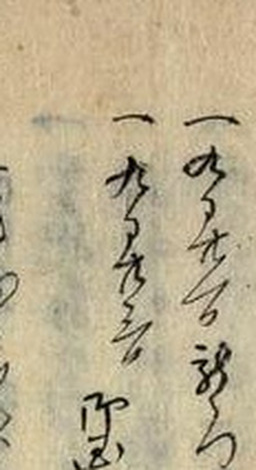一九月廿三日
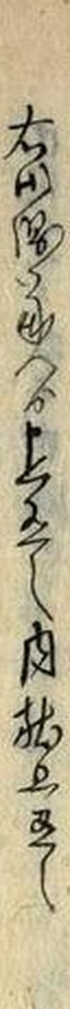右御側御用人ゟ申上有之内献上有之
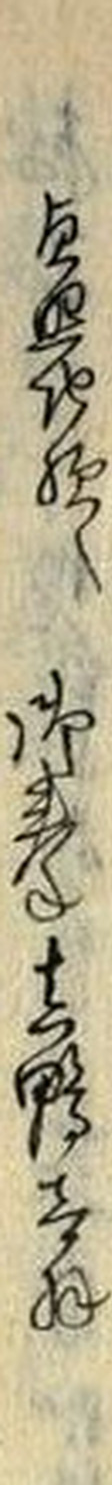貞照院様へ御拳真鴨壱羽
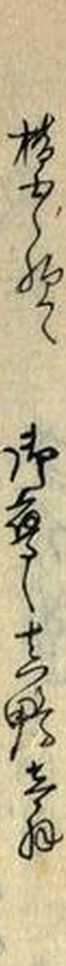揩五郎様へ御鷹之真鴨壱羽
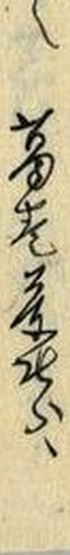葛巻藤次郎へ
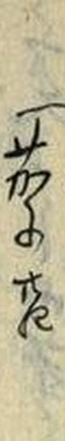茄子廿四
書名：少傅日録抄（斉承付側向頭取日記、在国）
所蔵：福井県文書館 Fukui Prefectural Archives
